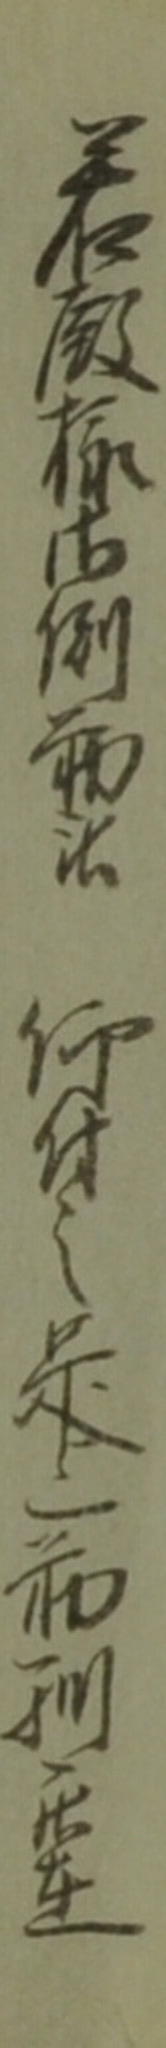若殿様御側勤被仰付之是迄勤馴罷在
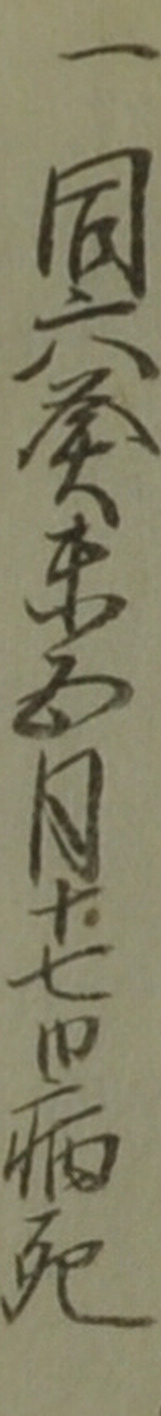一同六癸未五月十七日病気
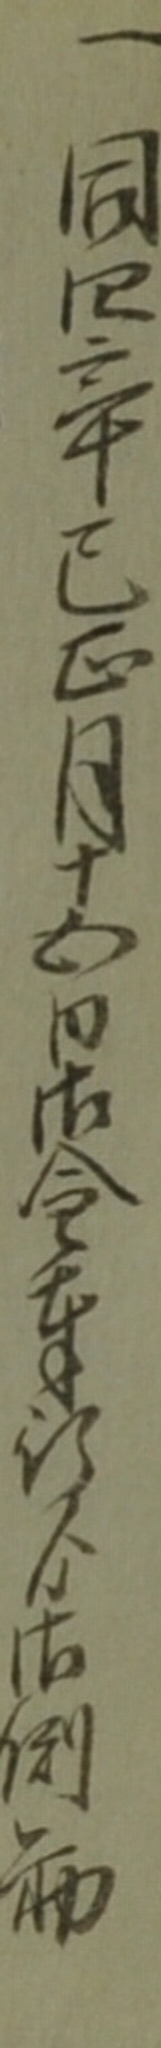一同四辛巳正月十五日御金奉行ゟ御側勤
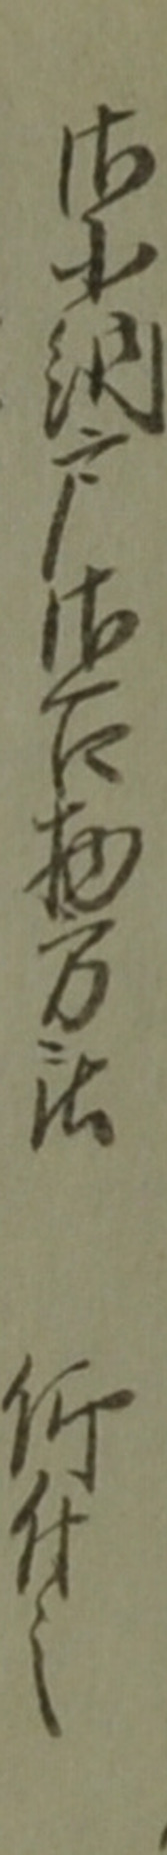御小納戸御召物方被仰付之
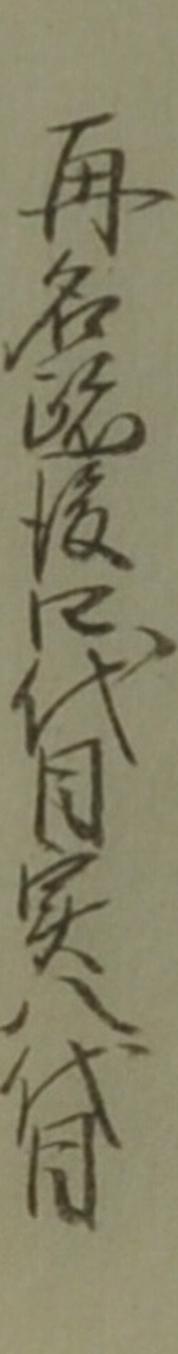再名跡後四代目実八代目
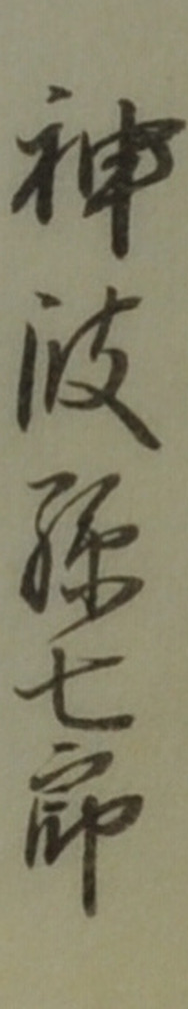神波孫七郎
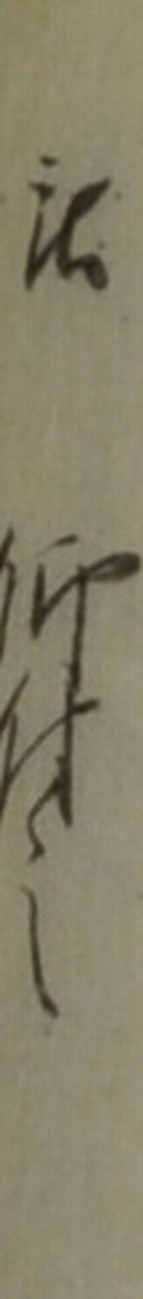被仰付之
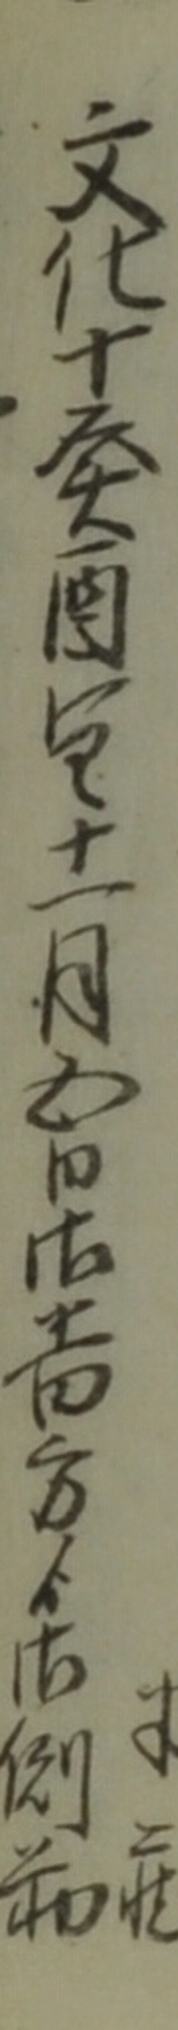一文化十癸酉閏十一月五日御番方ゟ御側勤
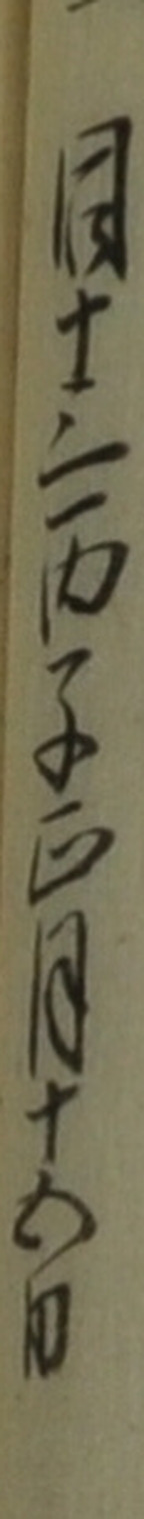一同十三丙子正月十五日
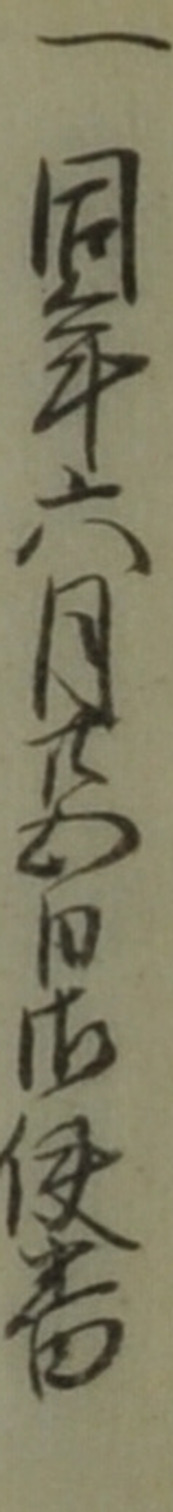一同年六月廿五日御使番
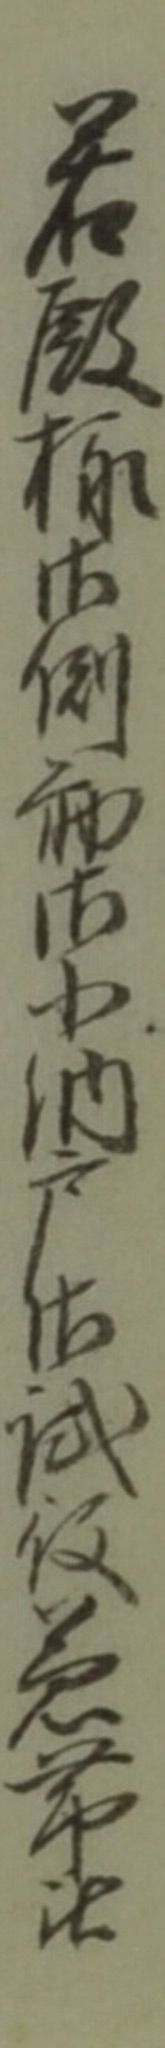若殿様御側勤御小納戸御試役兼帯被
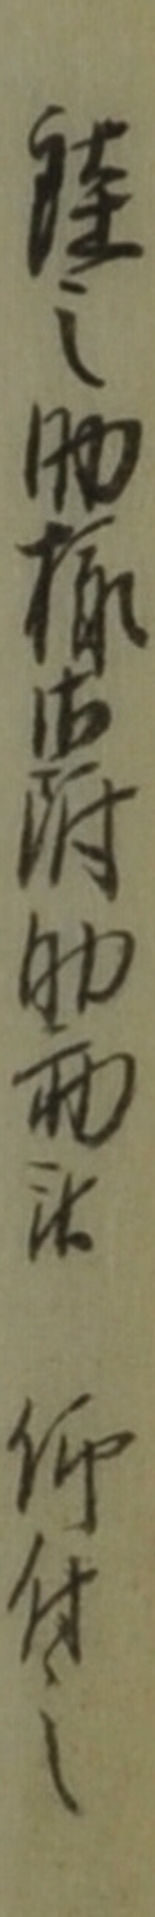銈之助様御附助勤被仰付之
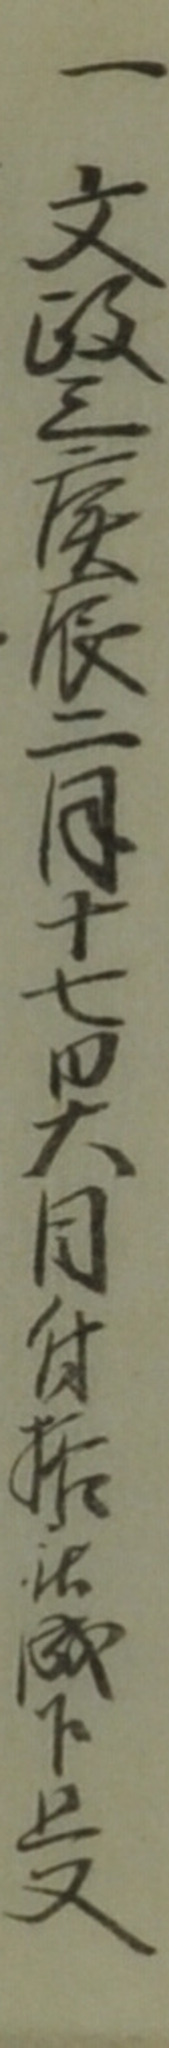一文政三庚辰二月十七日大目付格被成下且又
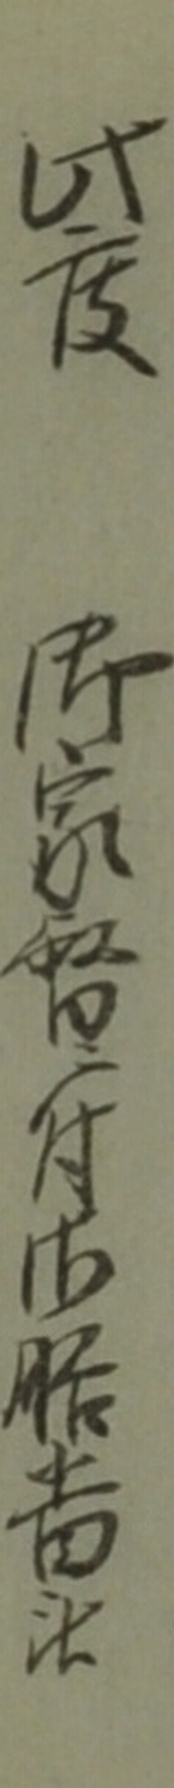此度御家督ニ付御膳番被
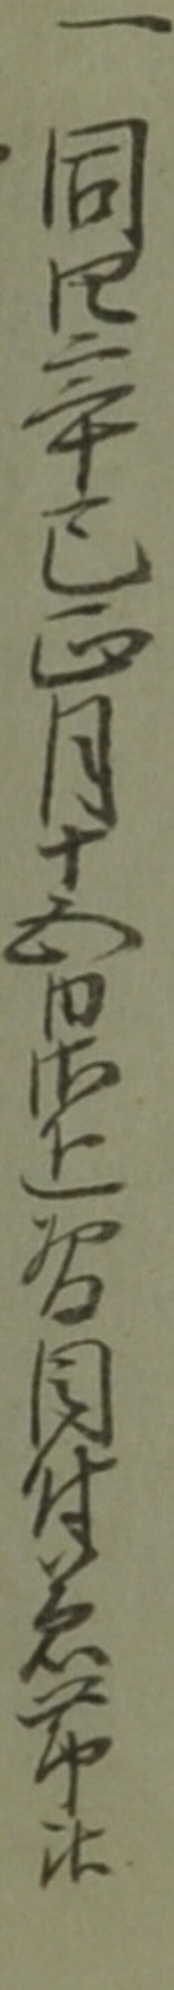一同四辛巳正月十五日御近習目付兼帯被
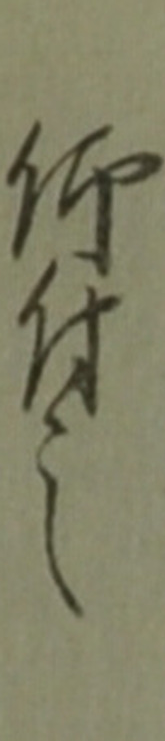仰付之
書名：諸御役代々録（五）
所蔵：伊那市立高遠町図書館・合同会社AMANE
